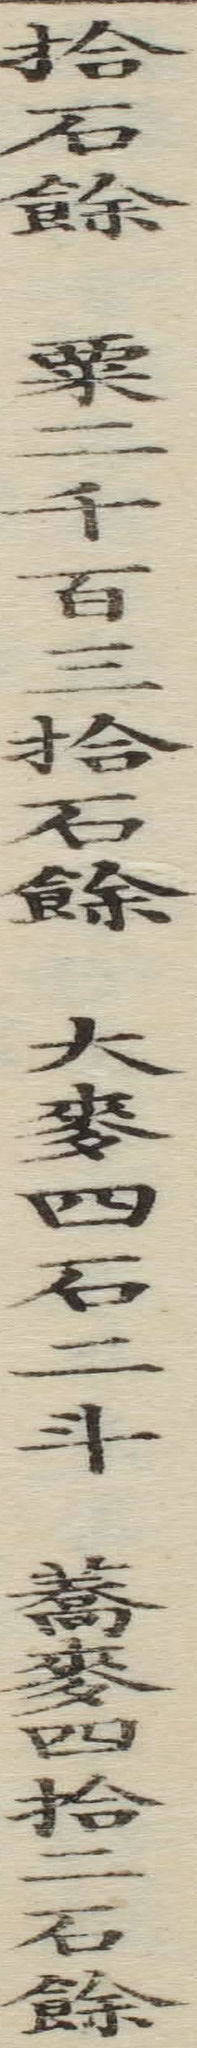拾石余粟二千百三拾石余大麦四石二斗蕎麦四拾二石余
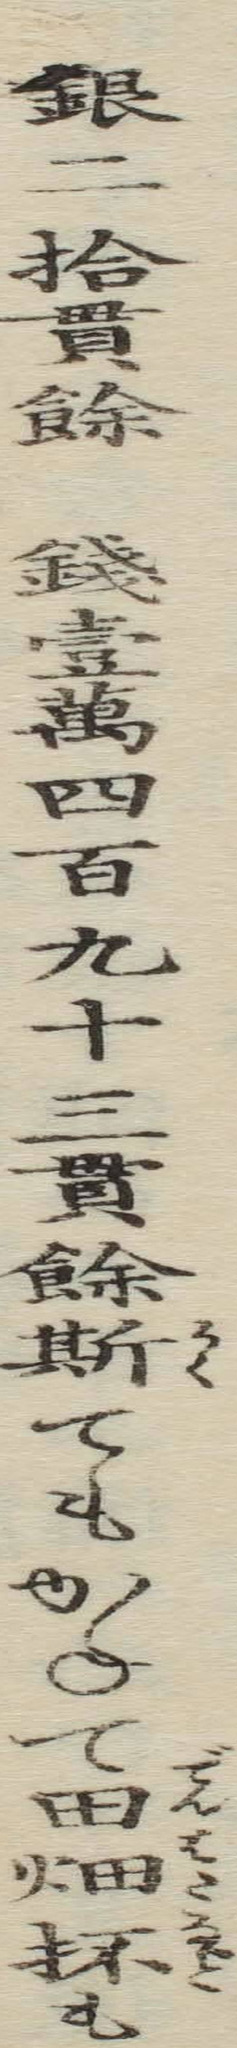銀二拾貫余銭壱万四百九十三貫余斯てもかねて田畑抔も
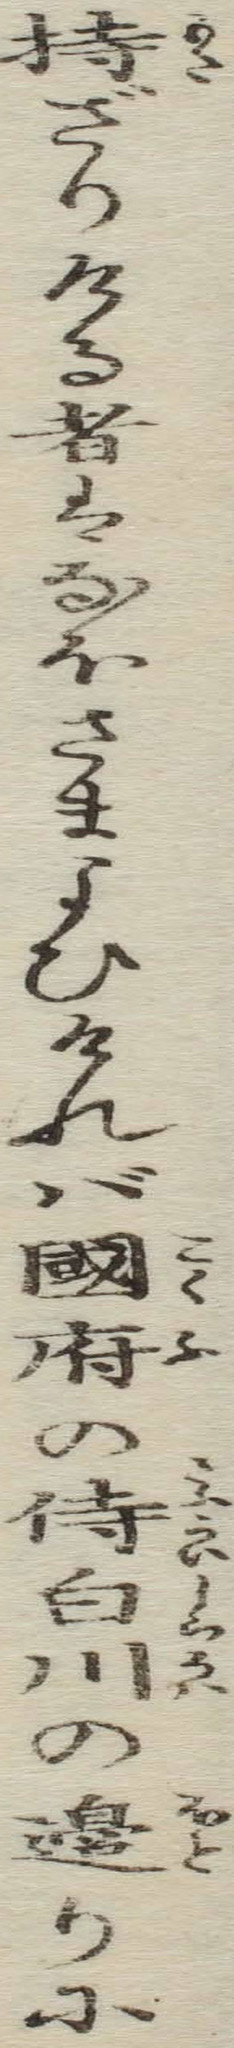持ざりける者はなほさまよひければ国府の侍白川の辺りに
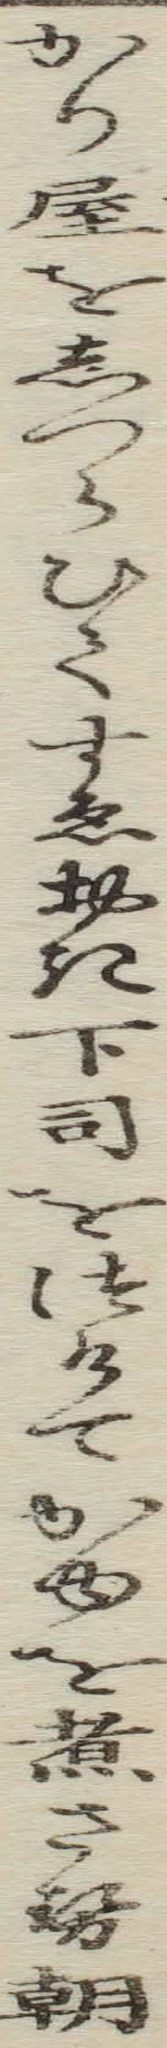かり屋をしつらひてすゑおき下司をつけてかゆを煮させ朝
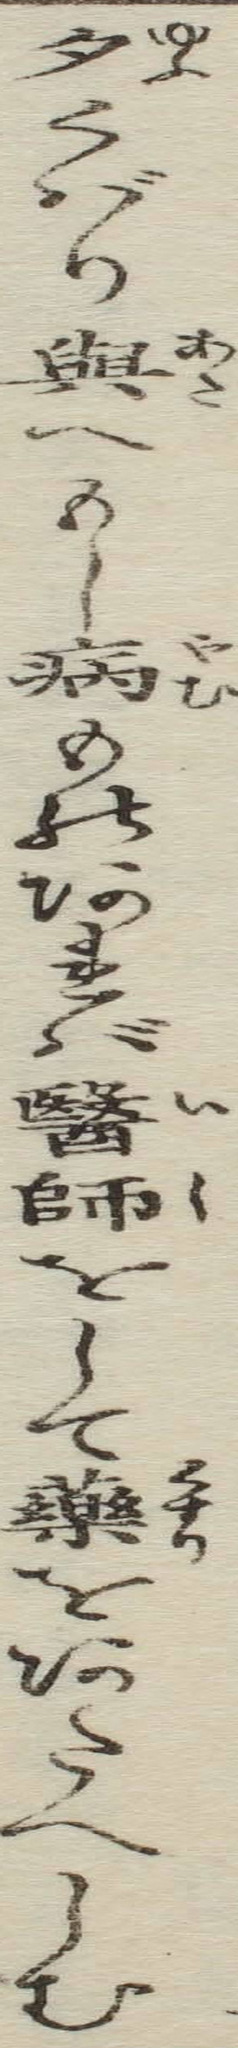夕くばり与へもし病ものあれば医師をして薬をあたへしむ
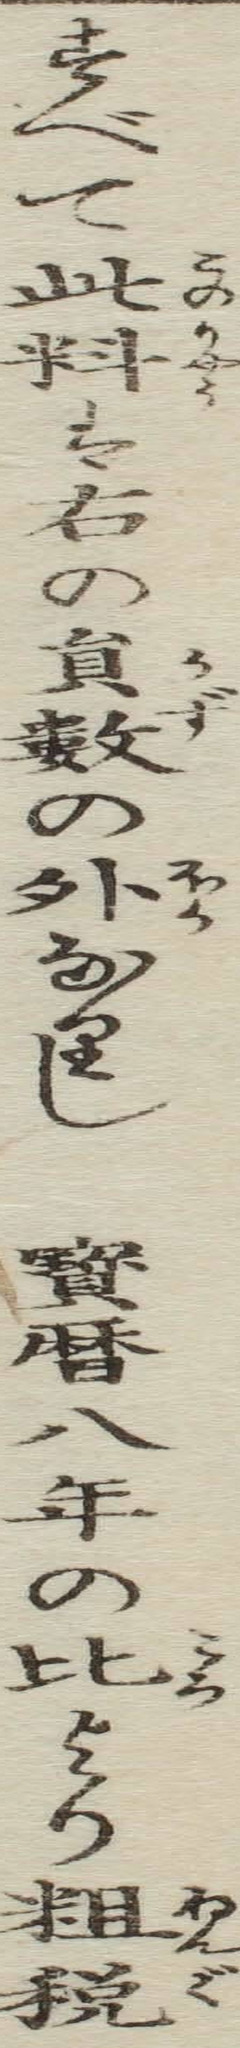すべて此料は右の員数の外なりし宝暦八年の比より粗税
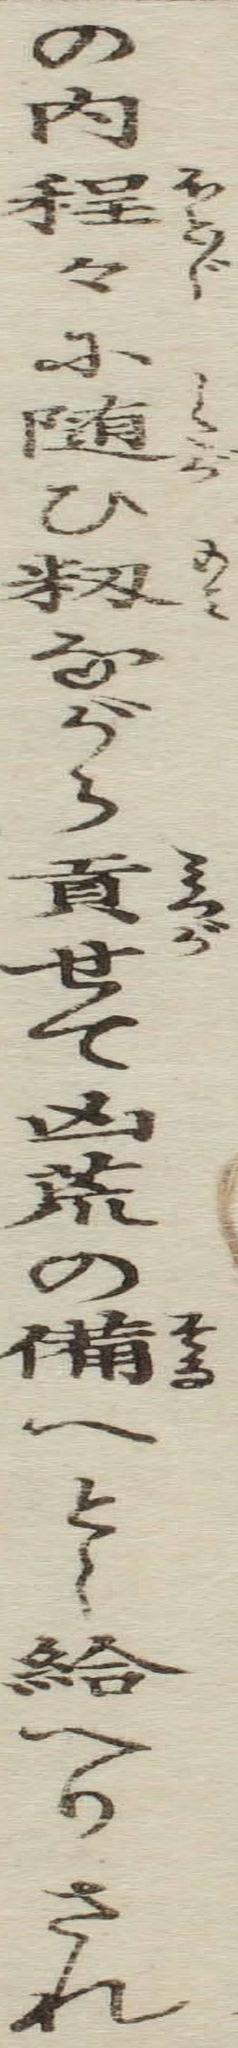の内程々に随ひ籾ながら貢せて凶荒の備へとし給へりされ
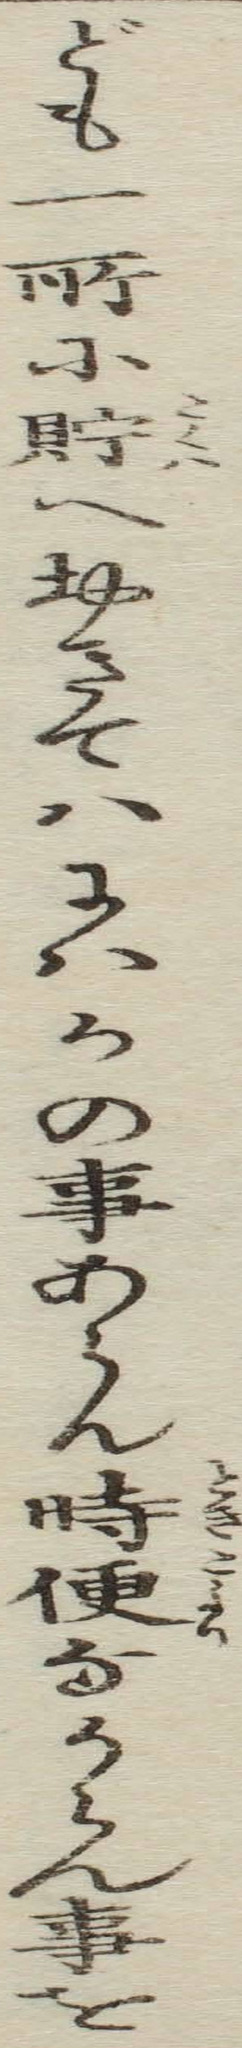ども一所に貯へおきてはにはかの事あらん時便なからん事を
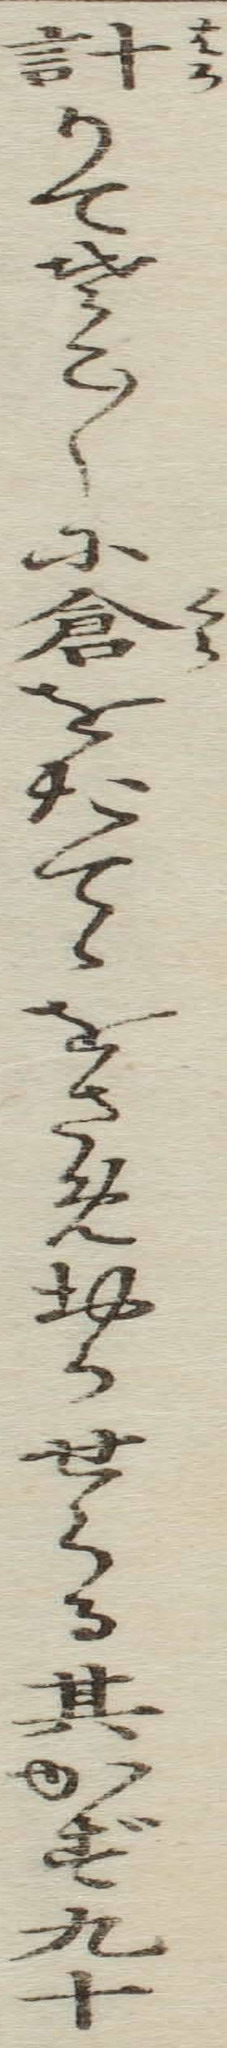計りてそこ〳〵に倉をたてゝをさめおかせらる其かず九十
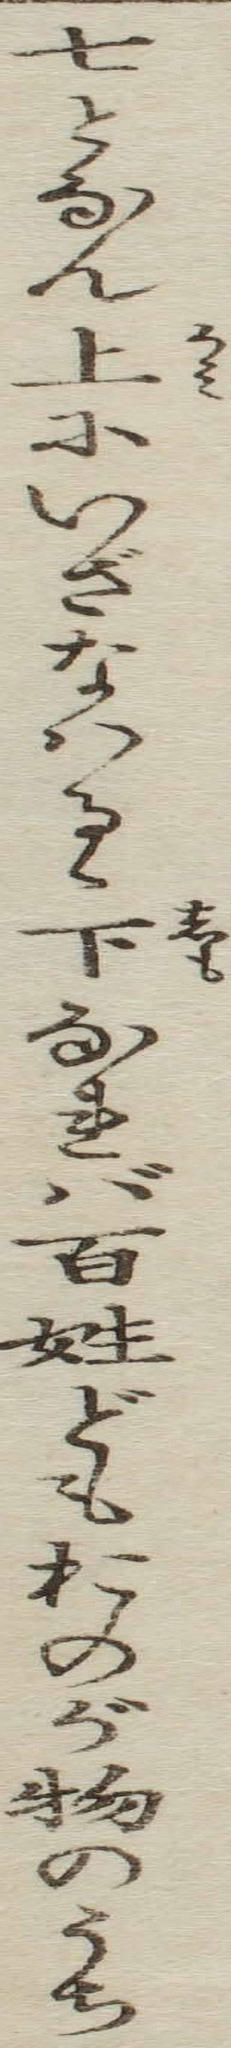七となん上にいざなはるゝ下なれば百姓どもおのが物のうち

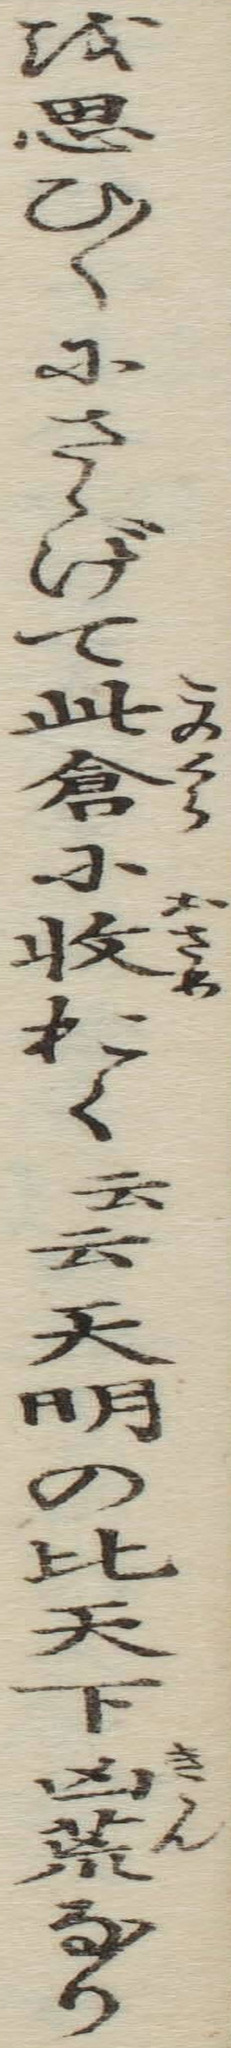を思ひ〳〵にさゝげて此倉に収おく云云天明の比天下凶荒なり
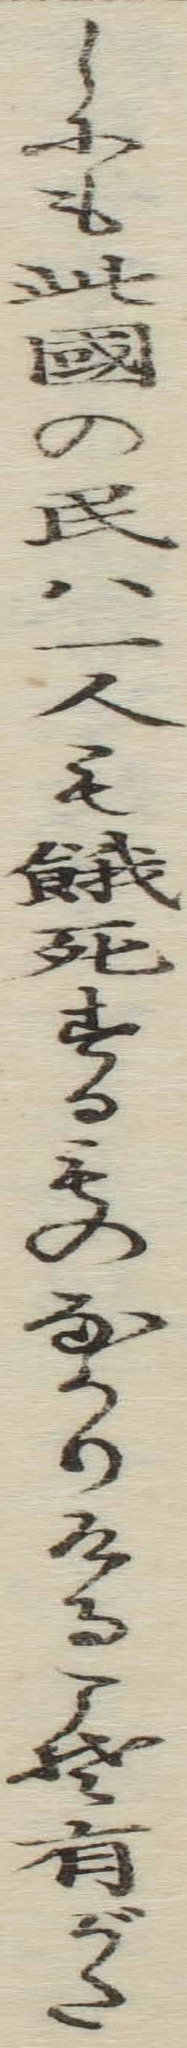しにも此国の民は一人も餓死するものなかりけるこそ有がた
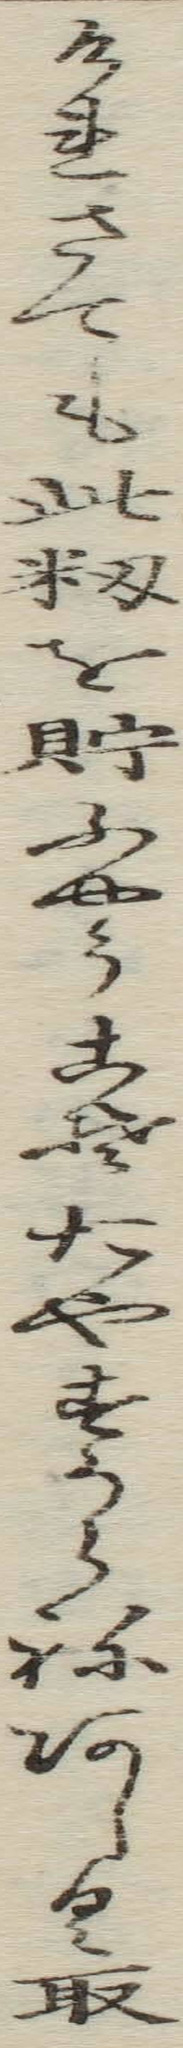けれさても此籾を貯ふやうこそたやすからねあしく取
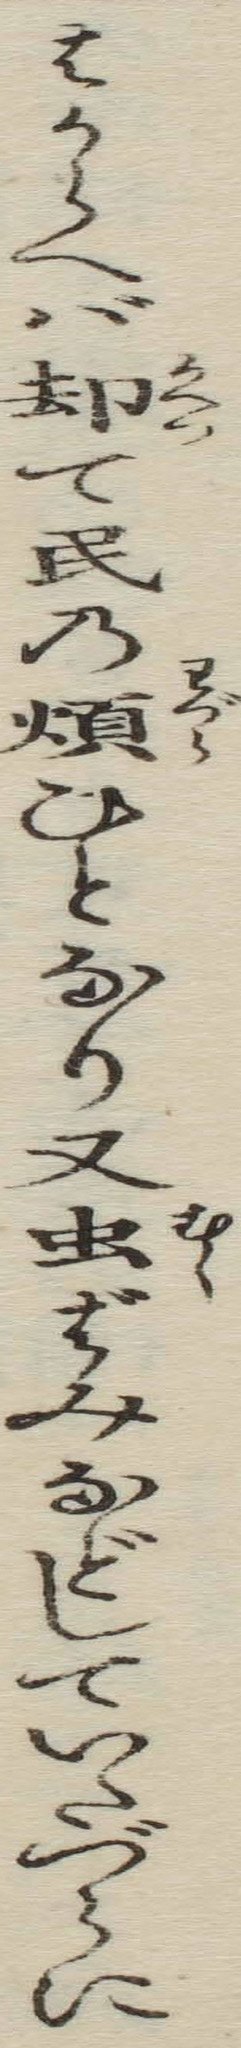はからへぼ却て民の煩ひとなり又虫ばみなどしていたづらに
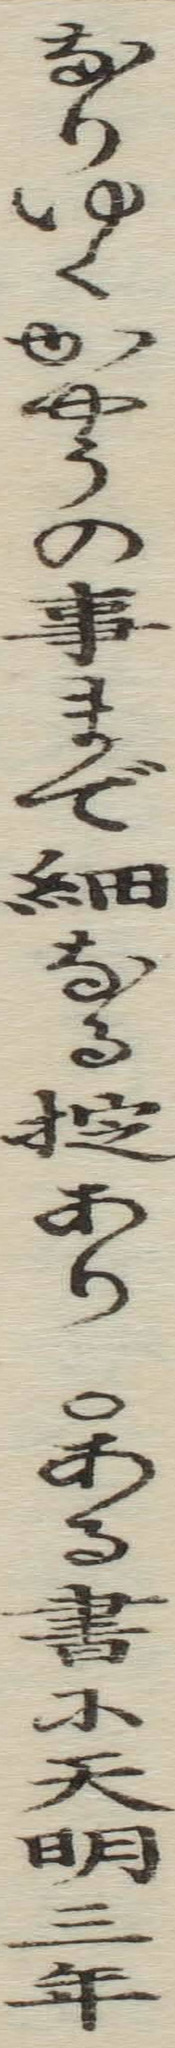なりゆくかやうの事まで細なる掟あり○ある書に天明三年
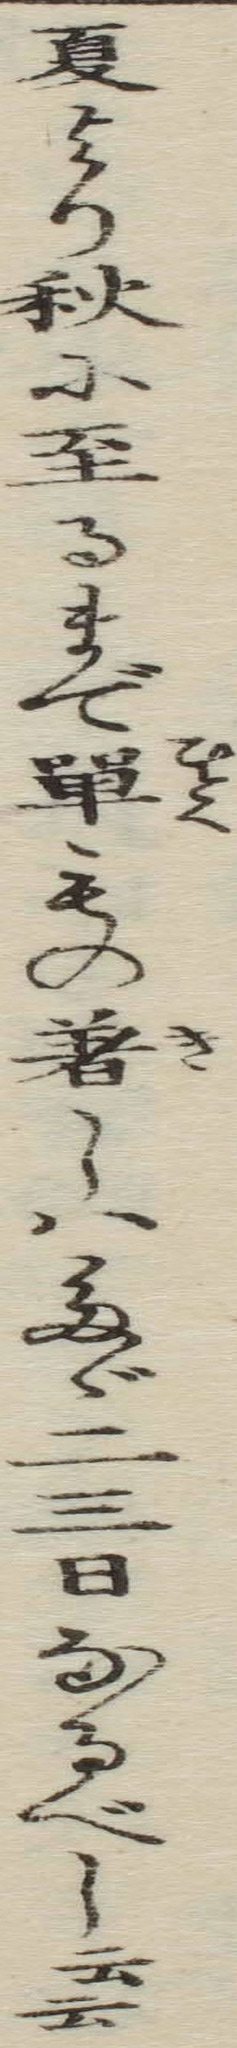夏より秋に至るまで単もの着しはたゞ二三日なるべし云云
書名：救荒便覧
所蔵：国文学研究資料館
